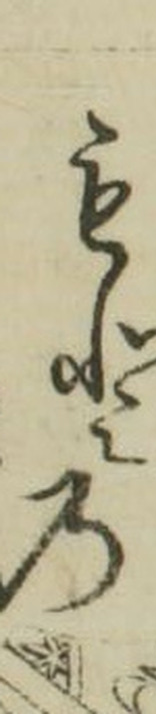もとの
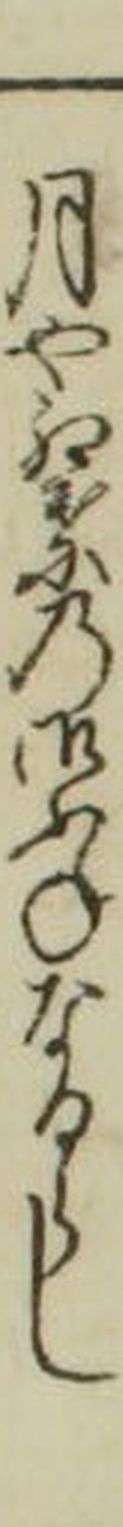月や紅葉の御ふねなるらし
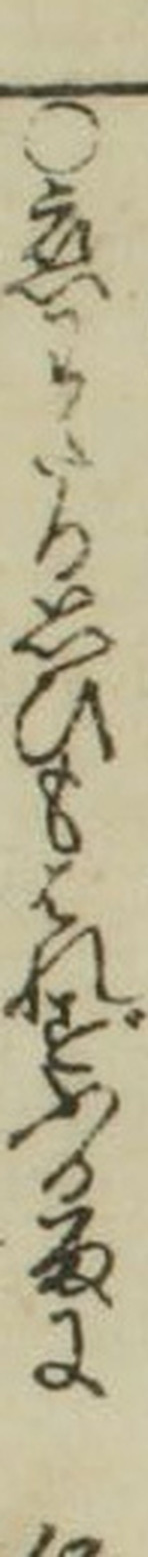○恋わたる思ひもはれずふる雨に経慶
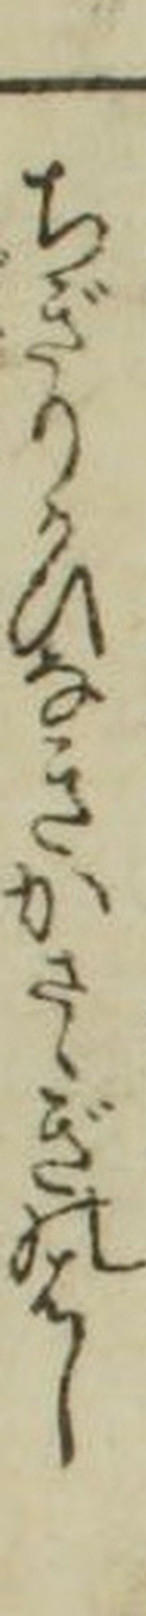ちぎりかひなきかさゝぎのはし
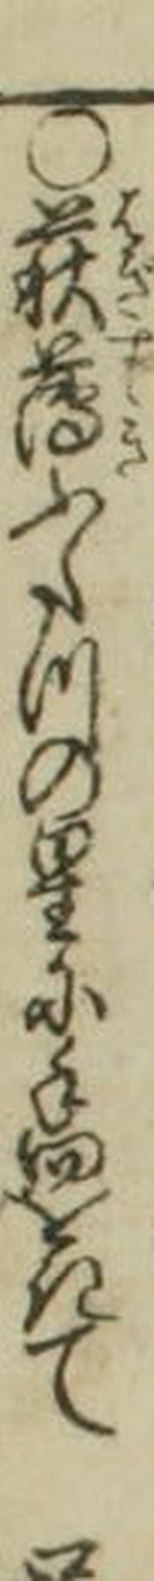○萩薄ふたつの星に手向をきて通村
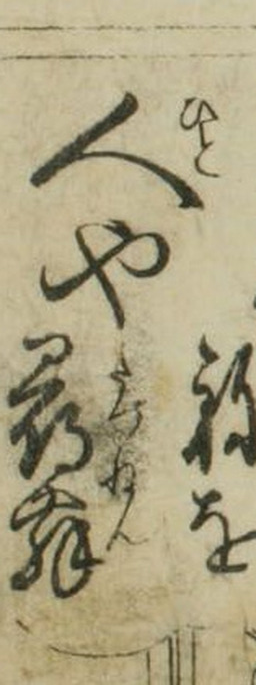人や尋む
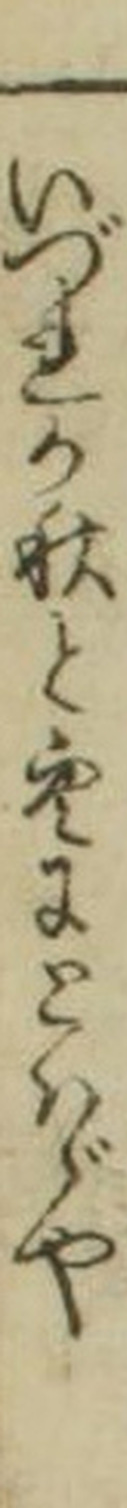いづれか秋と空にとはゞや

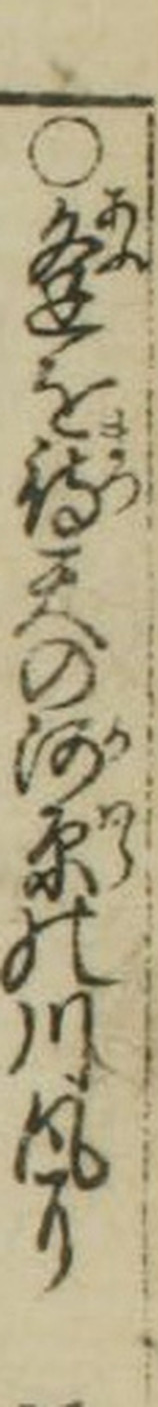○逢を待天の河原の川風に資慶
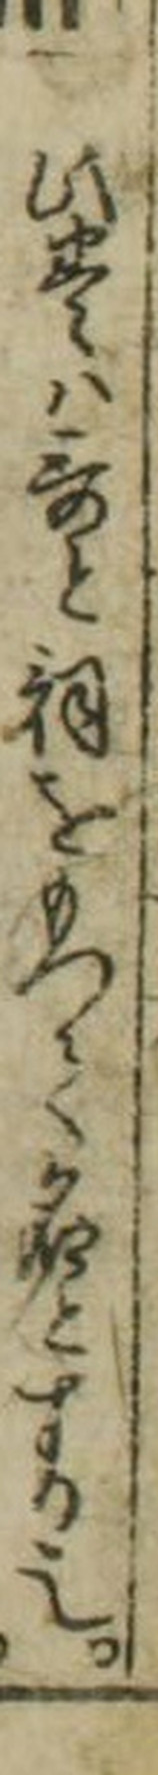此巻は哥と詞をもつて名とする也。
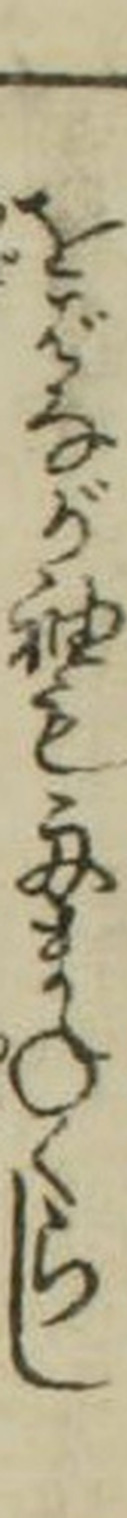をばなが袖も舟まねくらし
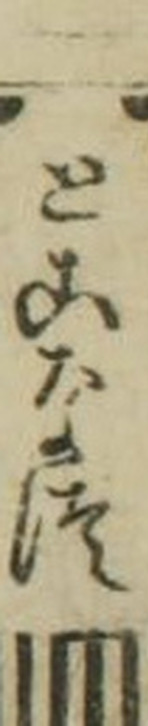「とこなつ
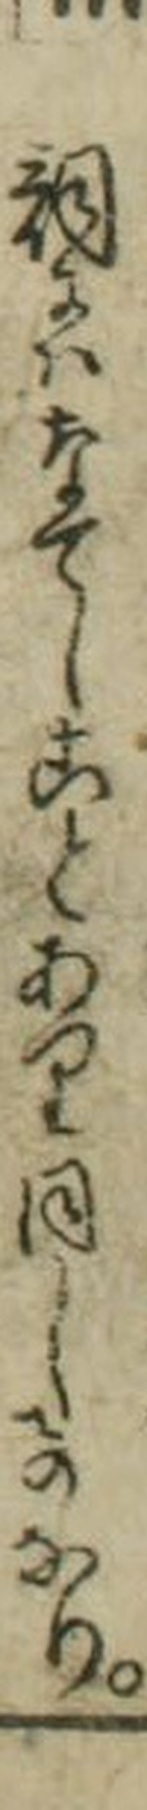詞にはなてしことあり同し事なり。
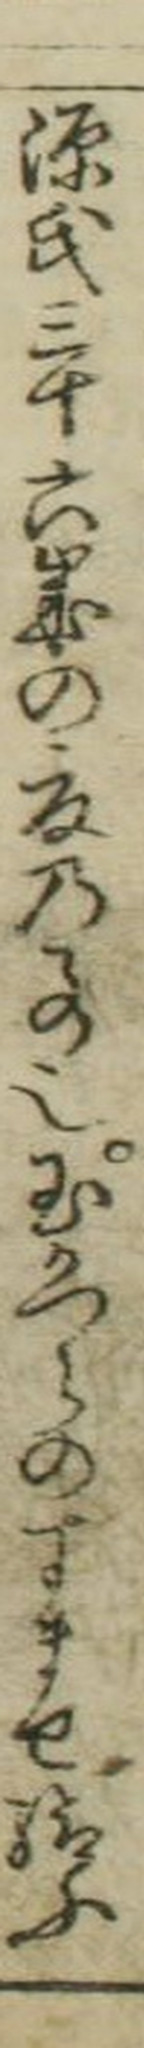源氏三十六歳の夏の事也。玉かつらのすませ給ふ
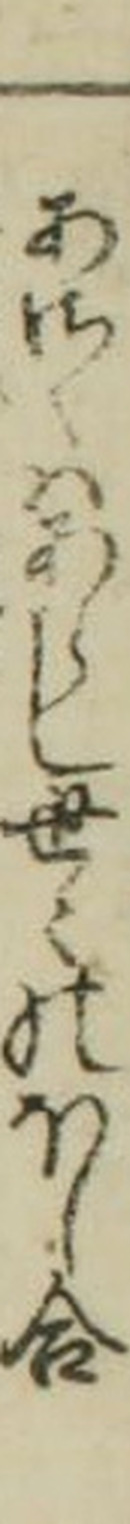あさくはあらし世々のほし合
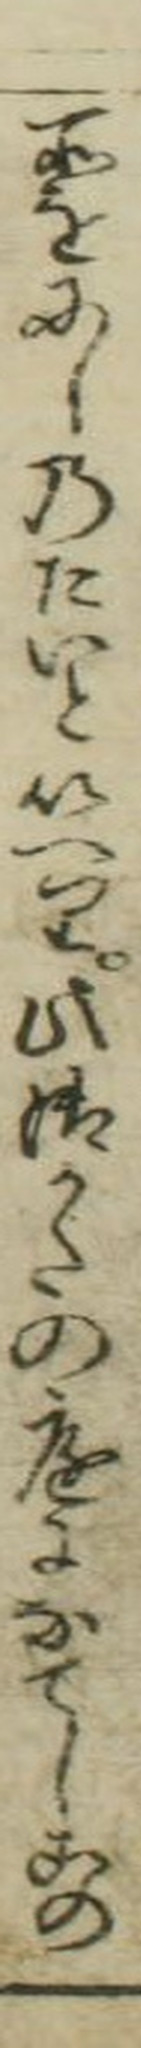所をにしのたいといへり。此御かたの庭になてしこの
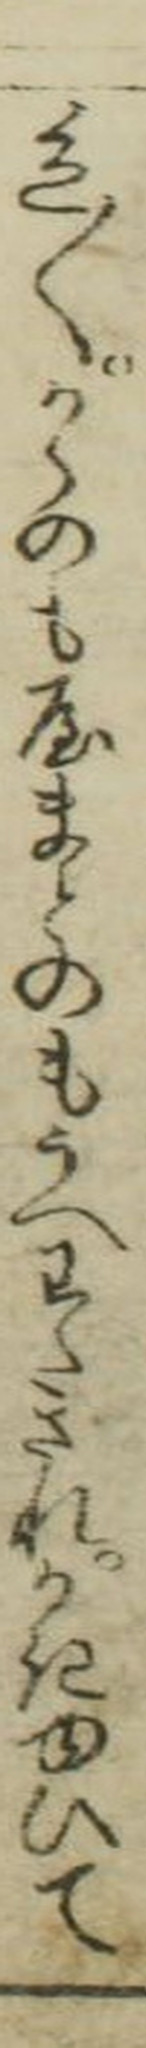色〳〵。からのもやまとのもうへわたされ。かきゆひて
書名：女源氏教訓鑑
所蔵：東京学芸大学附属図書館
